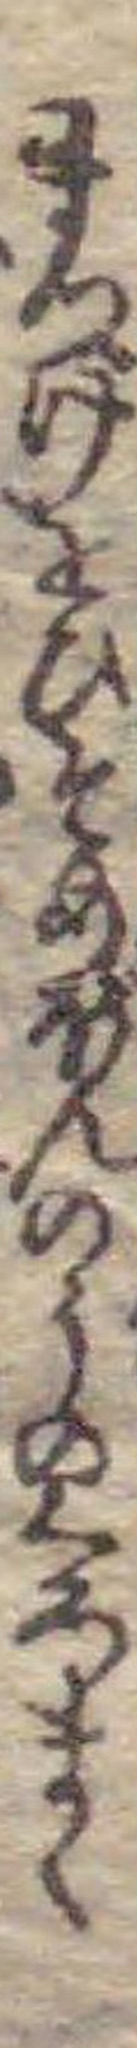まつげをひそめぼんのうのくろまく
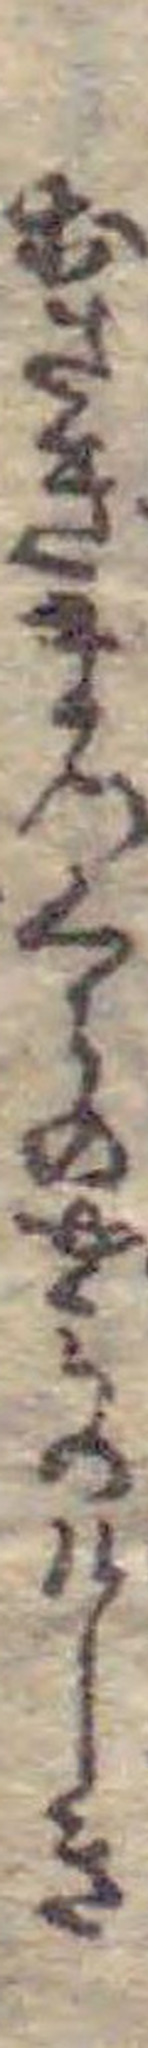おさきまつくらのやみのけしき
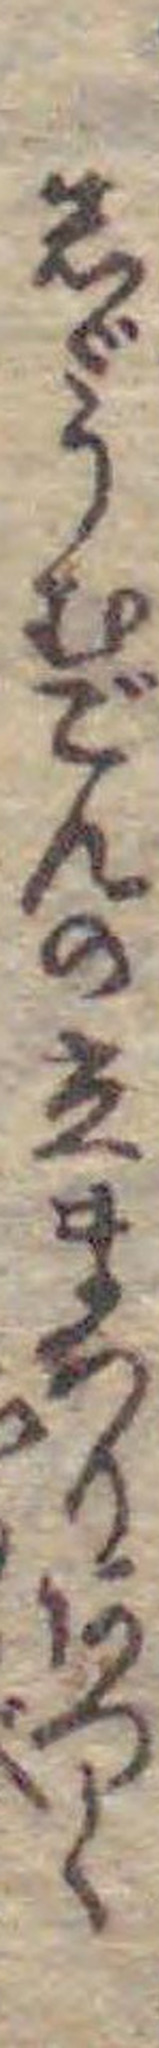しゞうむごんの立まはりあつて
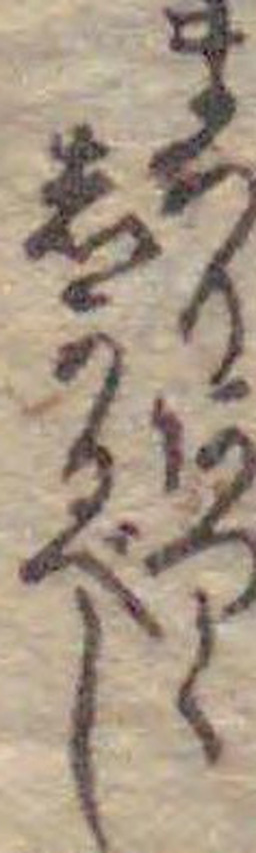しかるべし

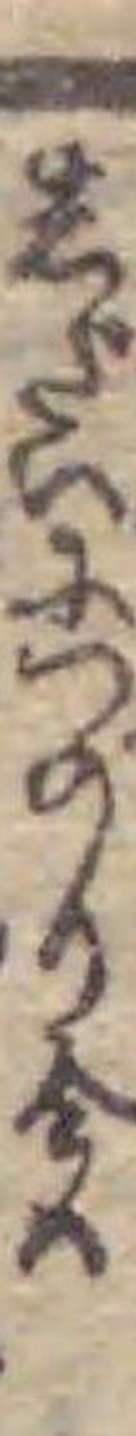しだいにつのり今は
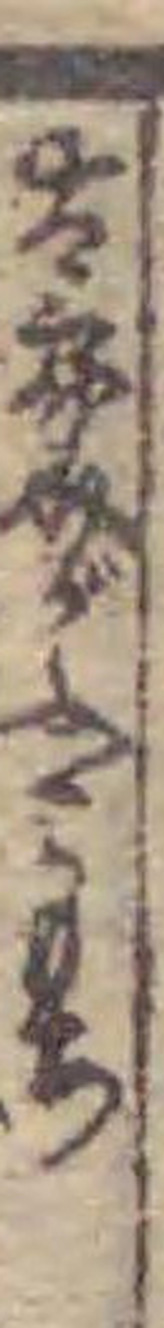太郎助がふみもち
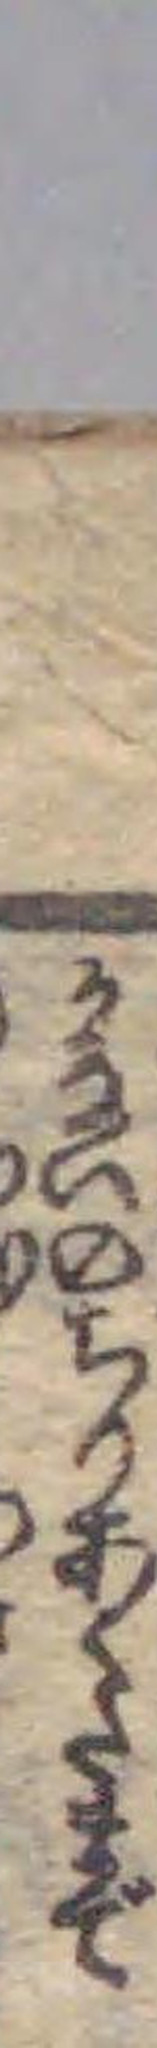かないのちりあくたまで
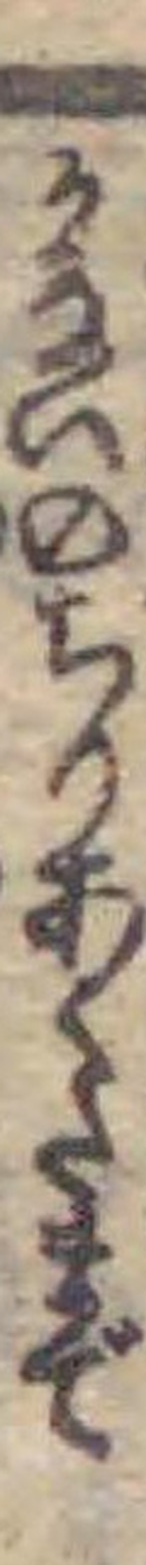かないのちりあくたまで
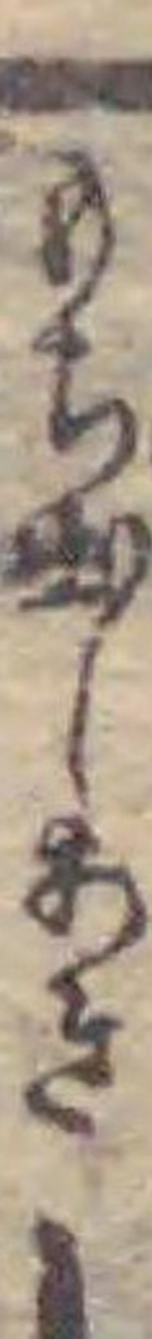もち出しあき
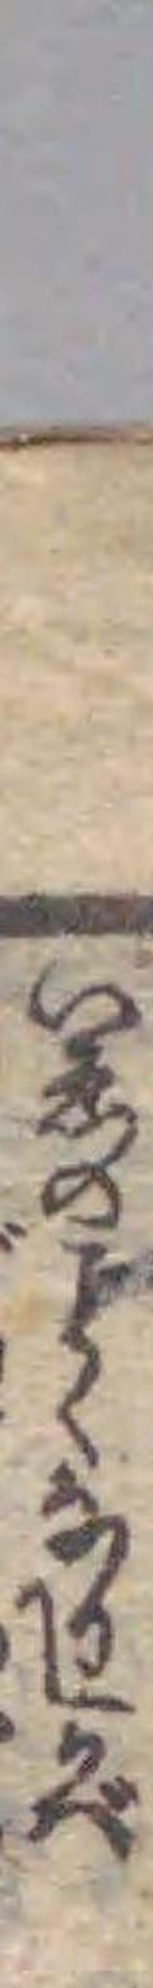いゑのごとくなりしかば
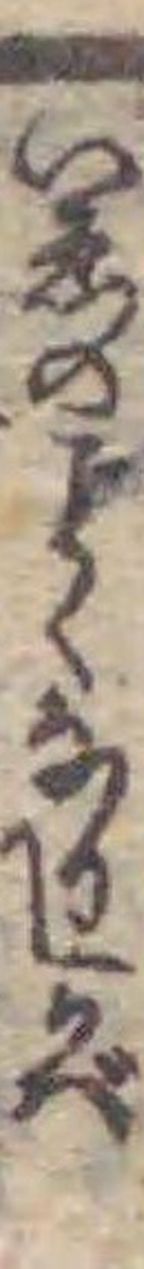いゑのごとくなりしかば
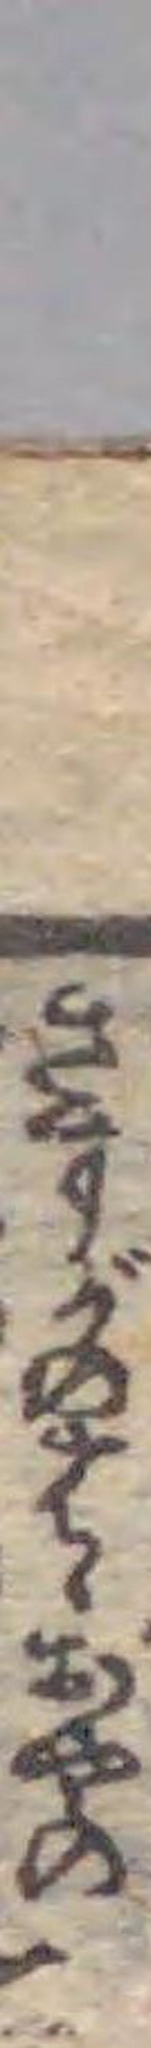さすがのはゝおやの
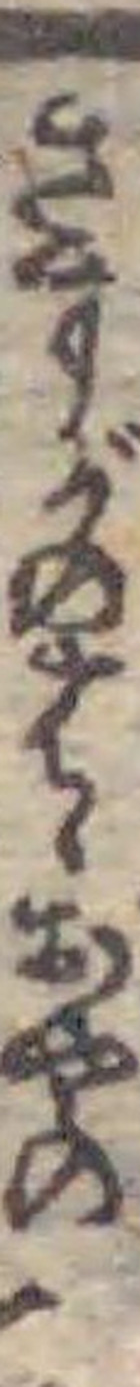さすがのはゝおやの
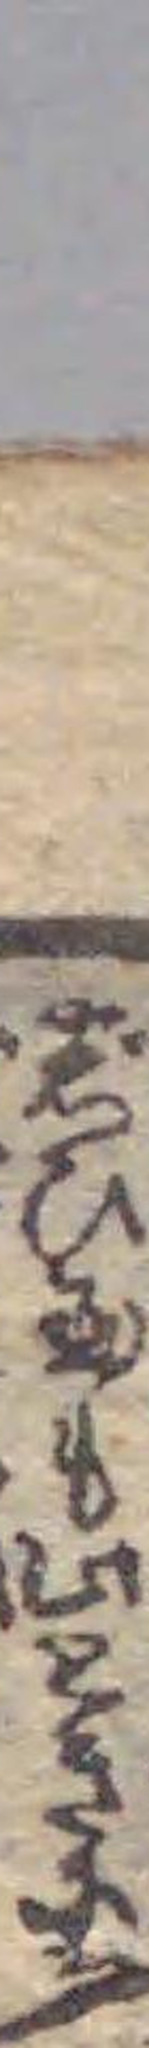じひ玉も此ときに
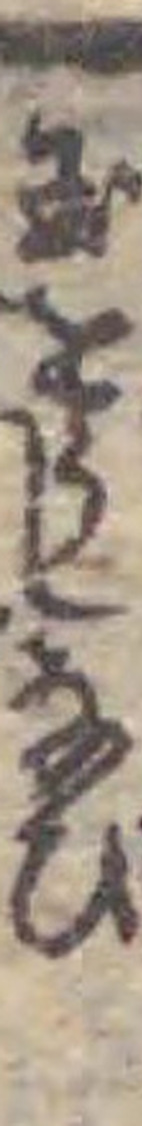玉をうしなひ
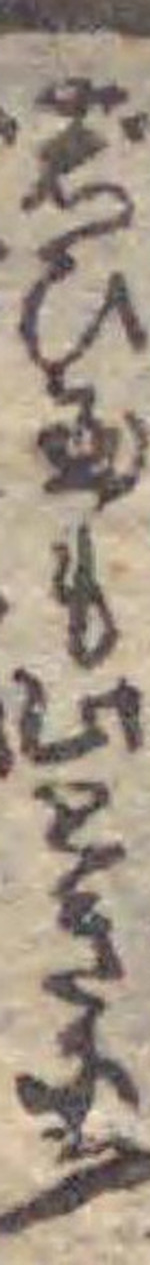じひ玉も此ときに
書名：四遍搨心学草帋 : 3巻
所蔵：国立国会図書館 National Diet Library, JAPAN
